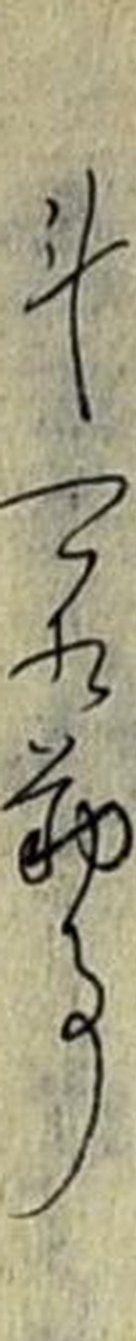斗可相勤事
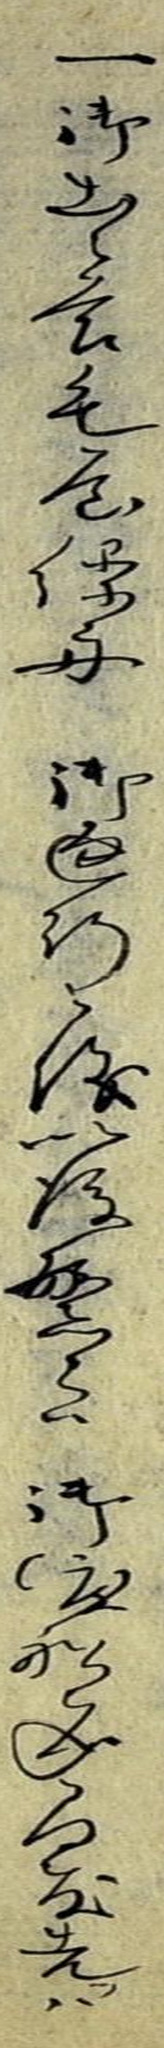一御出之節毛屋繰舟御通行之儀以後繁々は御渡船被成間敷先ッは
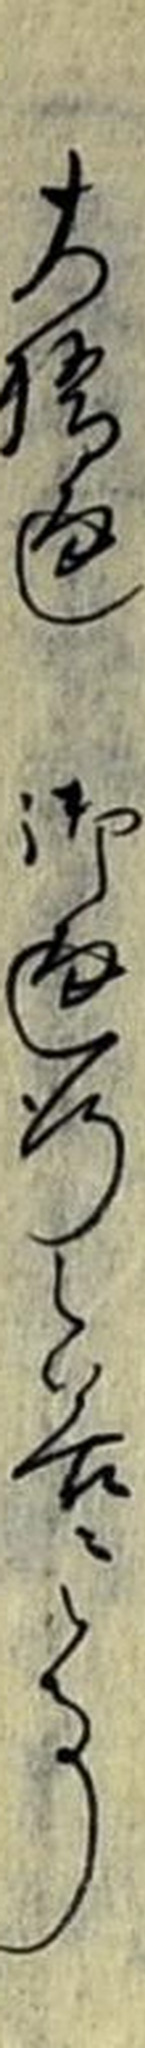大橋通御通行之筈に候事
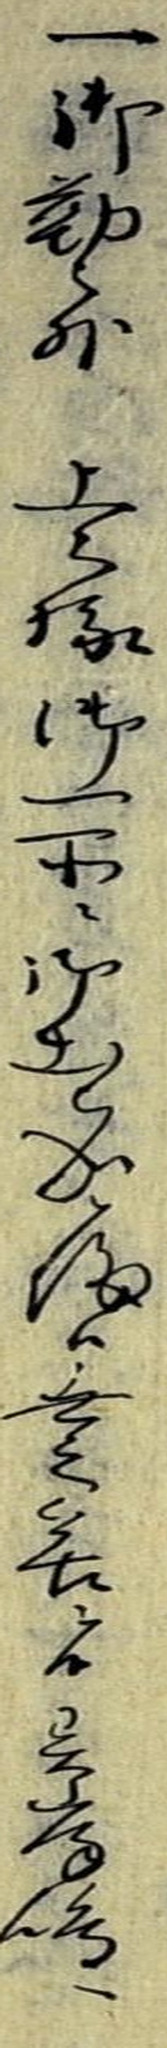一御勤之外上々様御一所に御出被成候儀は無之筈に候霊岸嶋へ
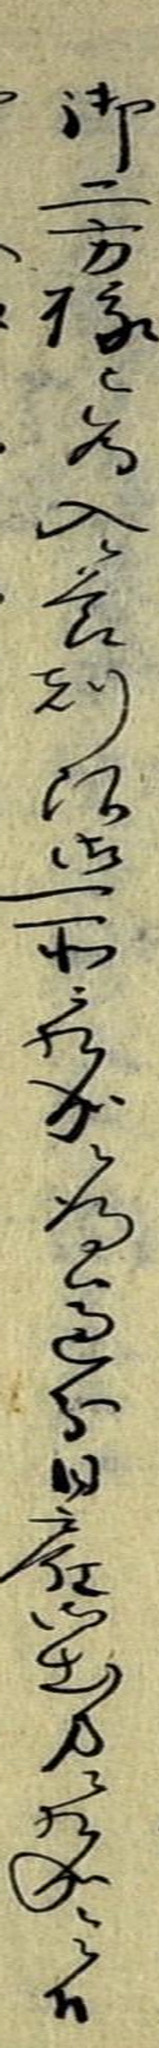御二方様被為入候節刻限御一所に相成候得は過分日雇御出方に相成候に付
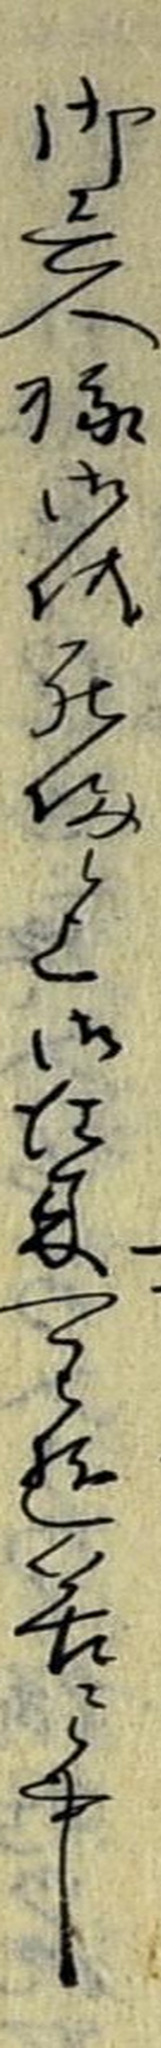御壱人様御供罷帰候上御往来可被遊筈に候事
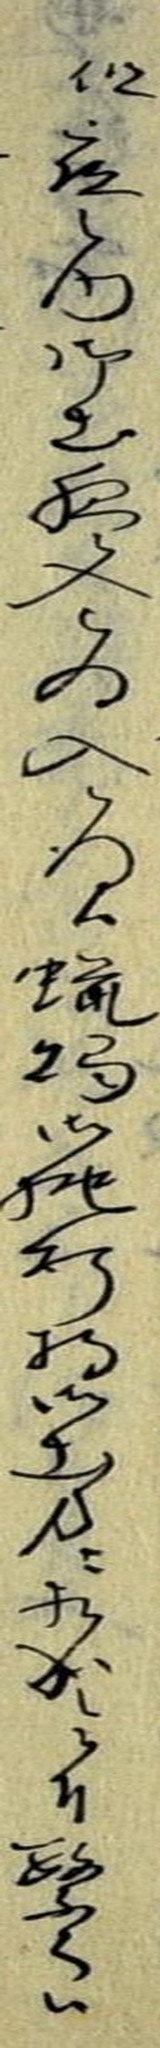但夜之内御出夜に入被為入候得は蝋燭御挑灯持御出方に相成候に付繁々は
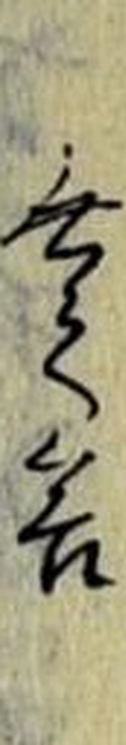無之筈
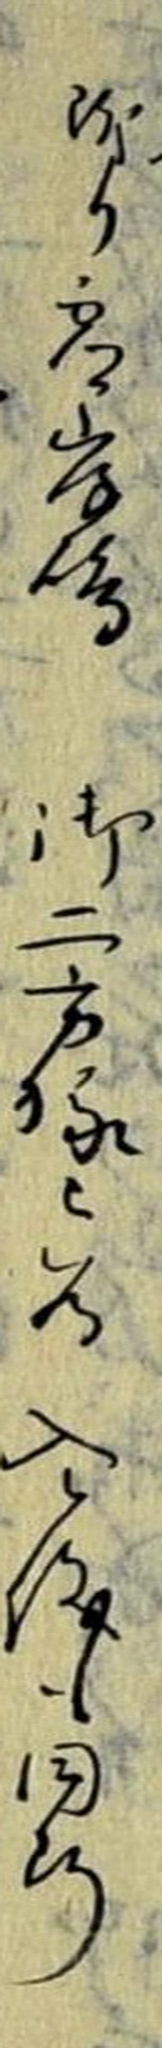附り霊岸嶋御二方様被為入候儀も同断
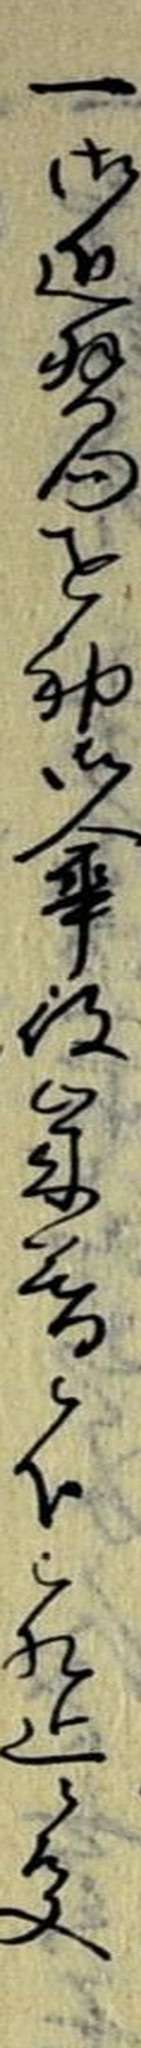一御近習向を初御傘役歳暮被下被相止候事
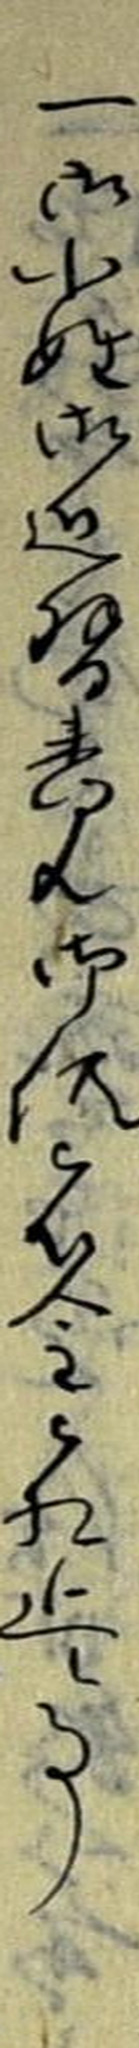一御小姓御近習番共御供被下金被相止候事
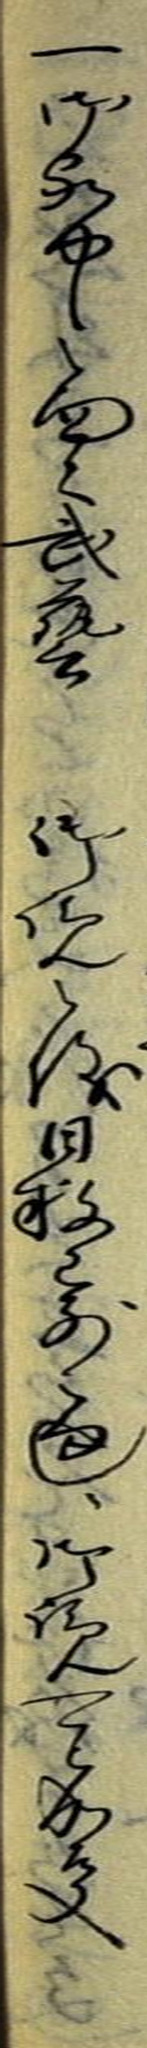一御家中之面々武芸御覧之儀日数已前之通に御覧可被成事
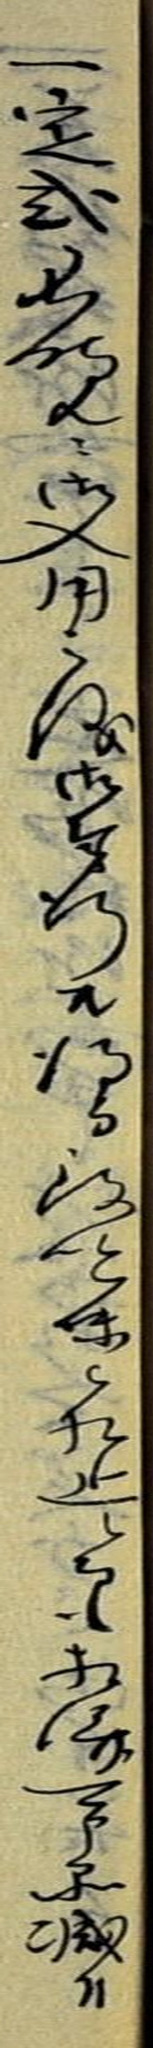一定式不時共に御入用之儀御奉行共特与致吟味被相止候而も相済可申品減付
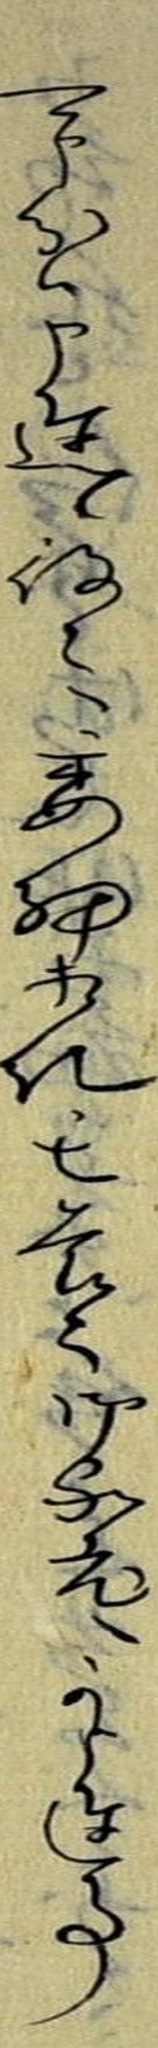可申分は申達候役々へ委細相糺其節々御家老へ可申達事
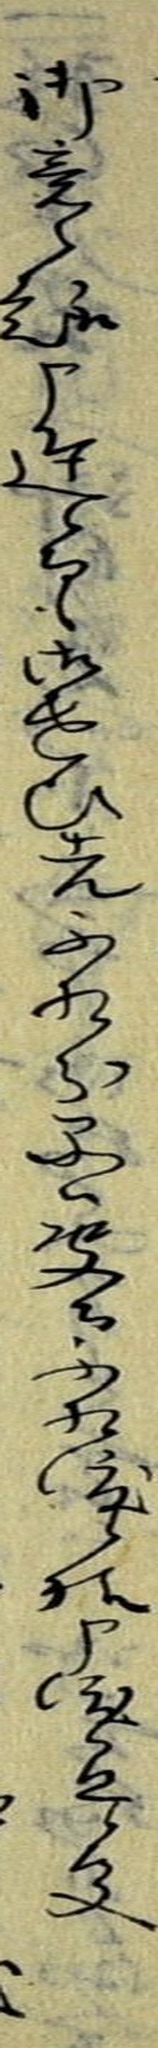御意之趣申達候而も御遣ひ先不相分品は決而不相渡候様申渡置候事
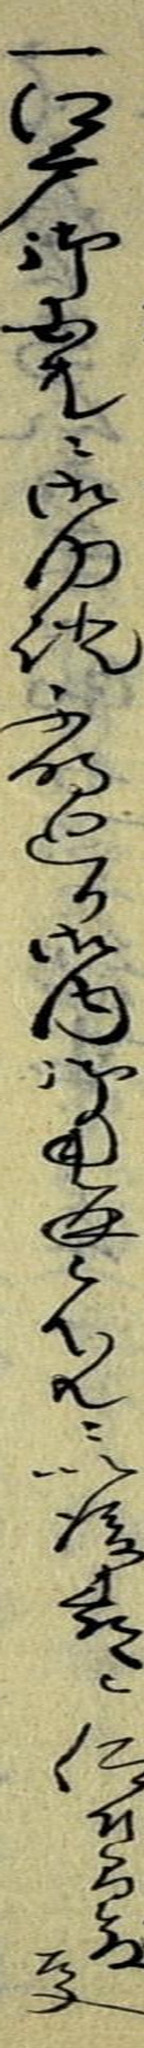一江戸御国共に御内証不時廻り御内御用并被下共に以後表へ被仰付間敷事
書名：命令之部 二
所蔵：福井県文書館 Fukui Prefectural Archives
